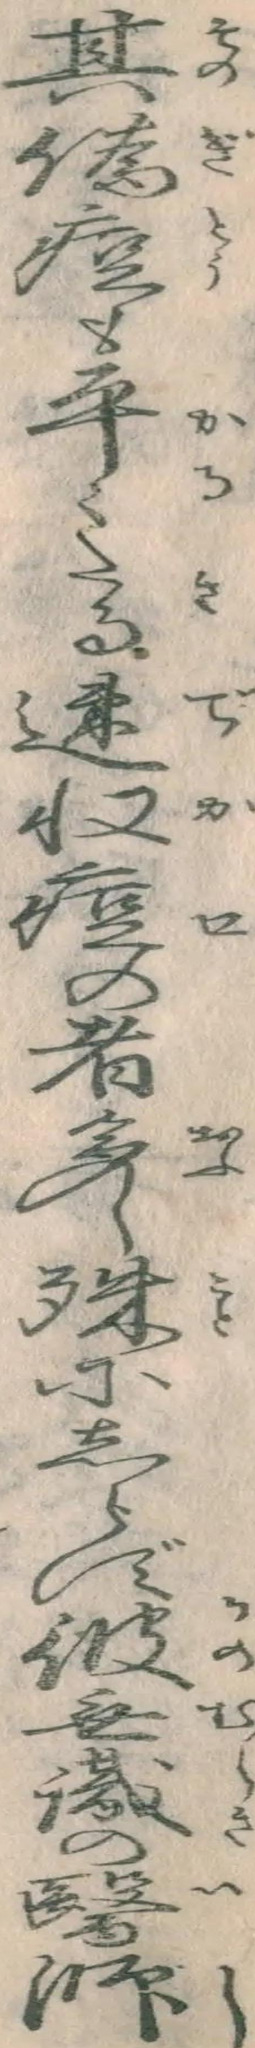其偽痘も平々たる速収痘の者多く殊にしらず彼無識の医師
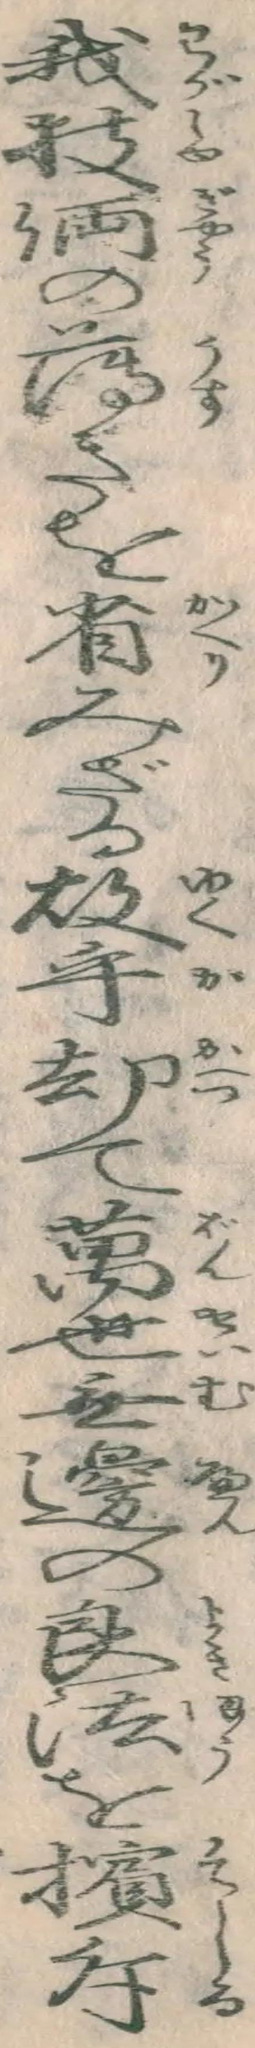我技量倆の薄きを省みざる故乎却て万世無辺の良法を損斥
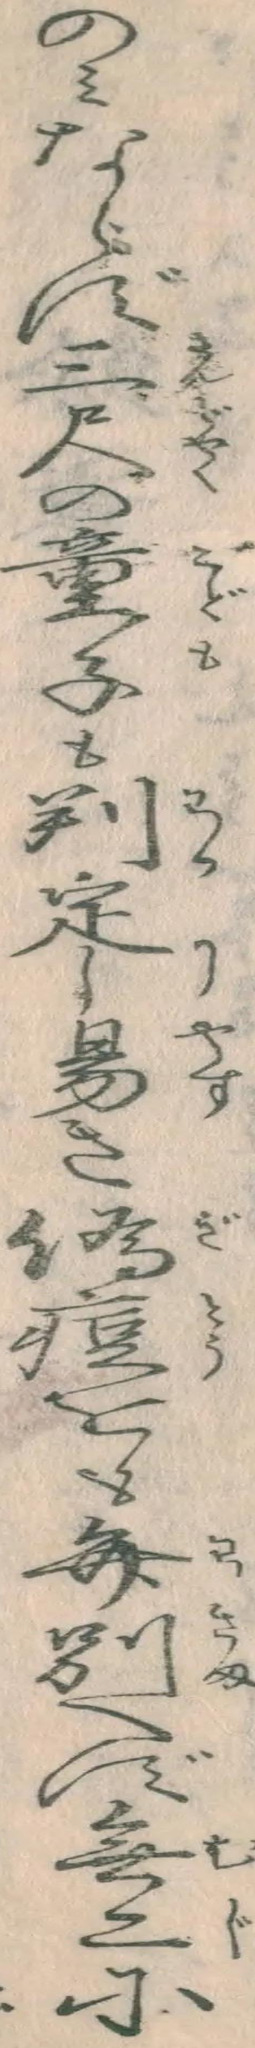のみならず三尺の童子も判定易き偽痘をも弁別へず無二に
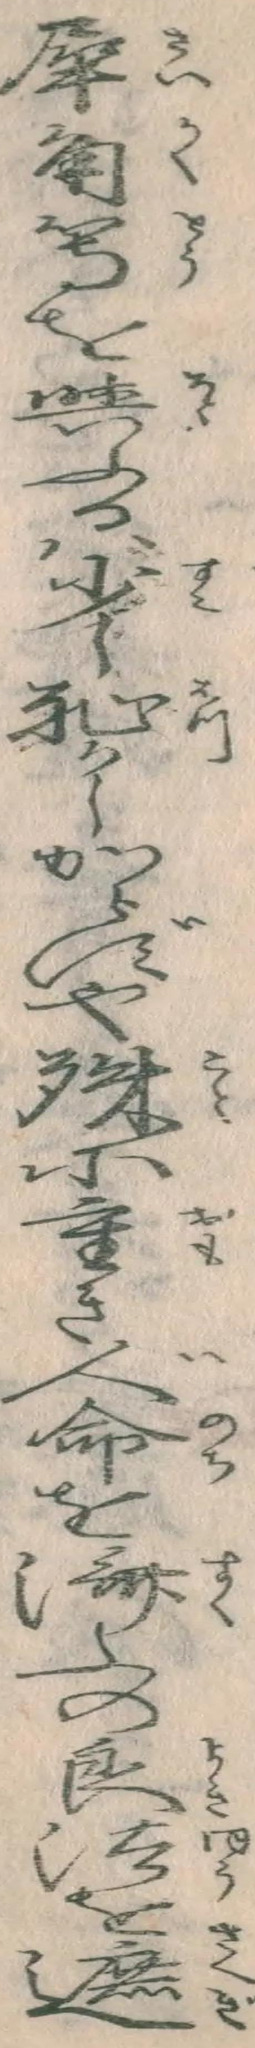犀角等をふるは少し恥かしからずや殊に重き人命を済ふの良法を遮
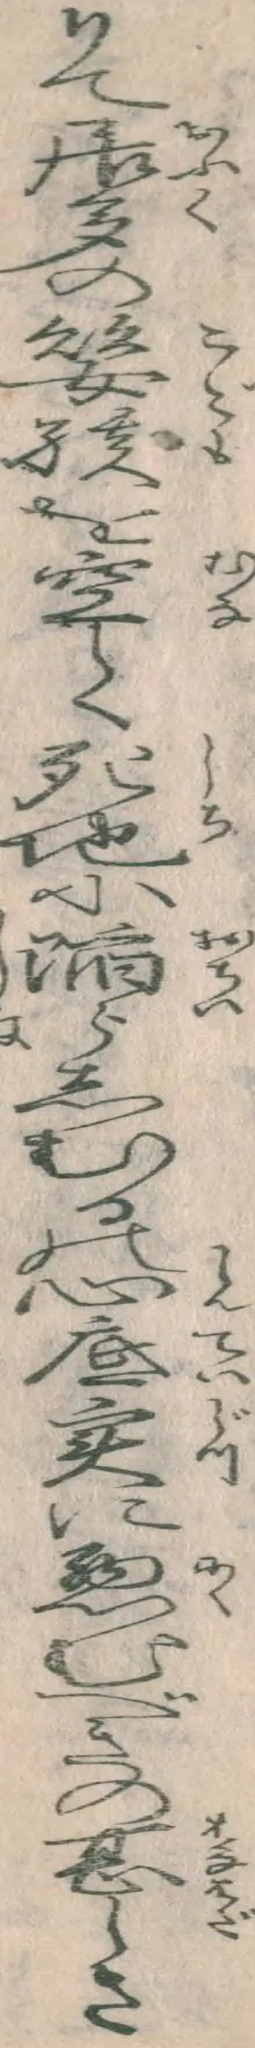りて居多の嬰孩を空しく死地に陥らしむるの心底実に悪むべきの甚しき
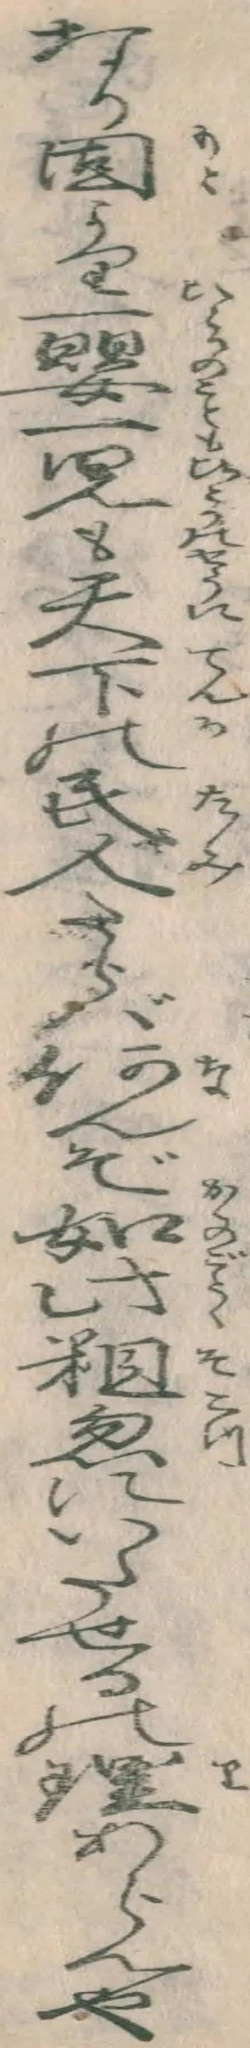なり固より一嬰一児も天下の民人たらば何んで如此粗忽にいたせるの理あらんや
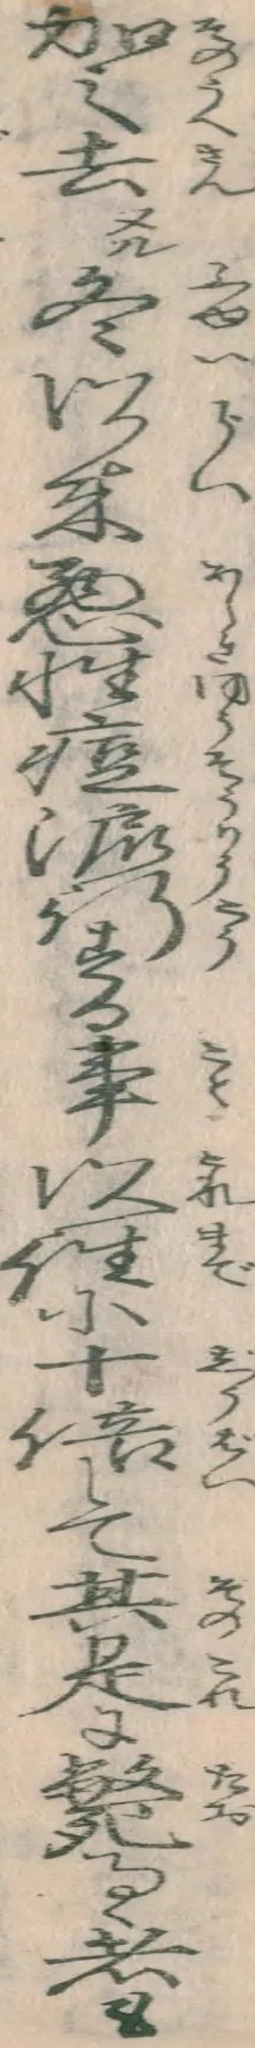加之去メル冬以来悪性痘流行する事以往に十倍して其是に斃るゝ者も
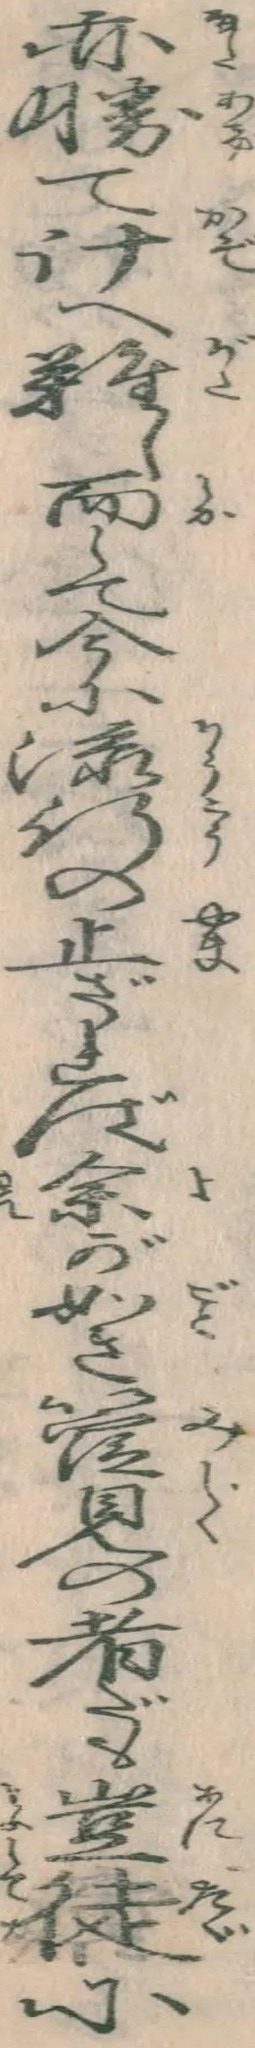亦勝て計へ難し而して今に流行の止ざれず余ば如き管見の者だも豈徒に
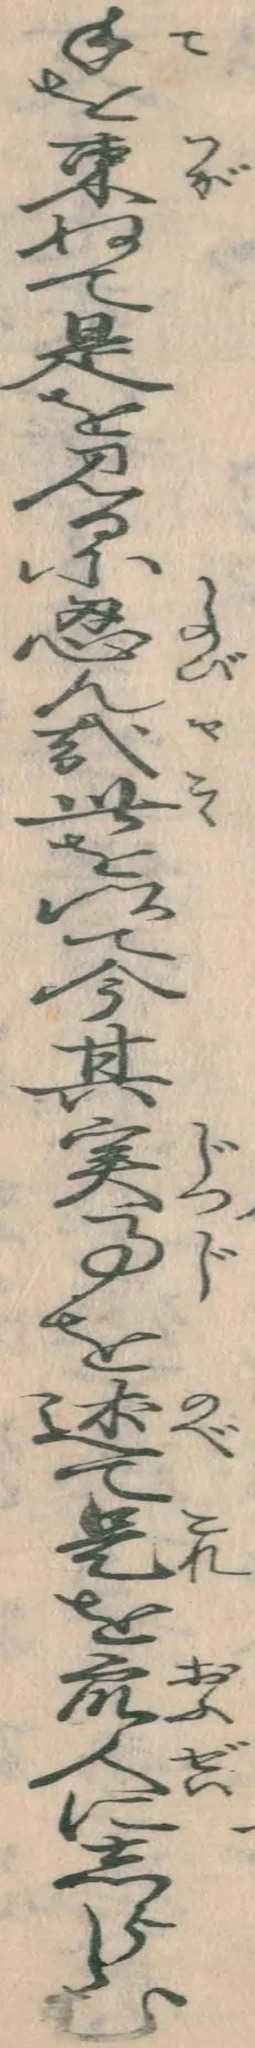手を束ねて是を見るに忍ん哉此を以て今其実事を述て是を衆人にしらしむ
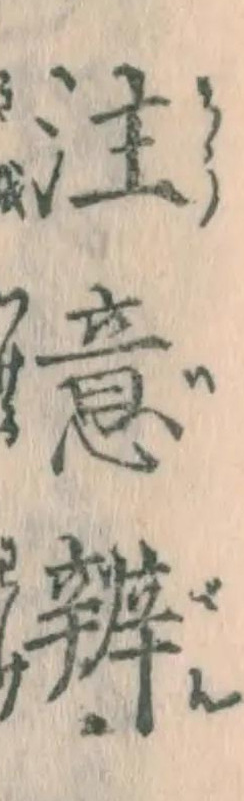注意弁
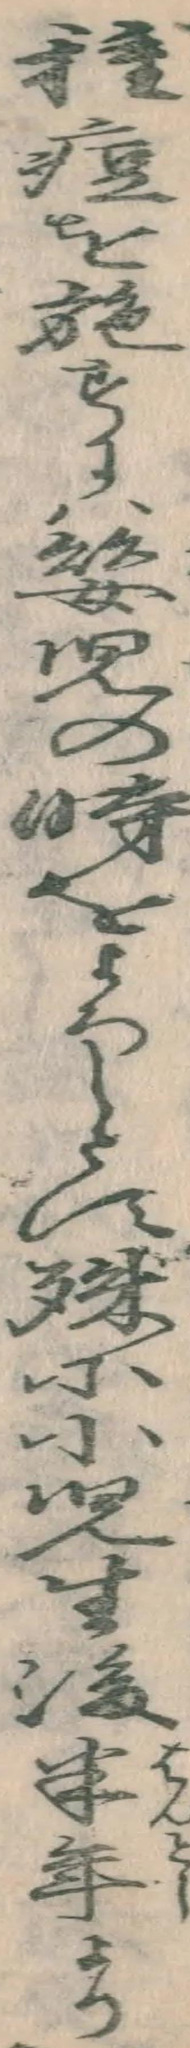種痘を施すには嬰児の時をよろしとす殊に小児生後半年より
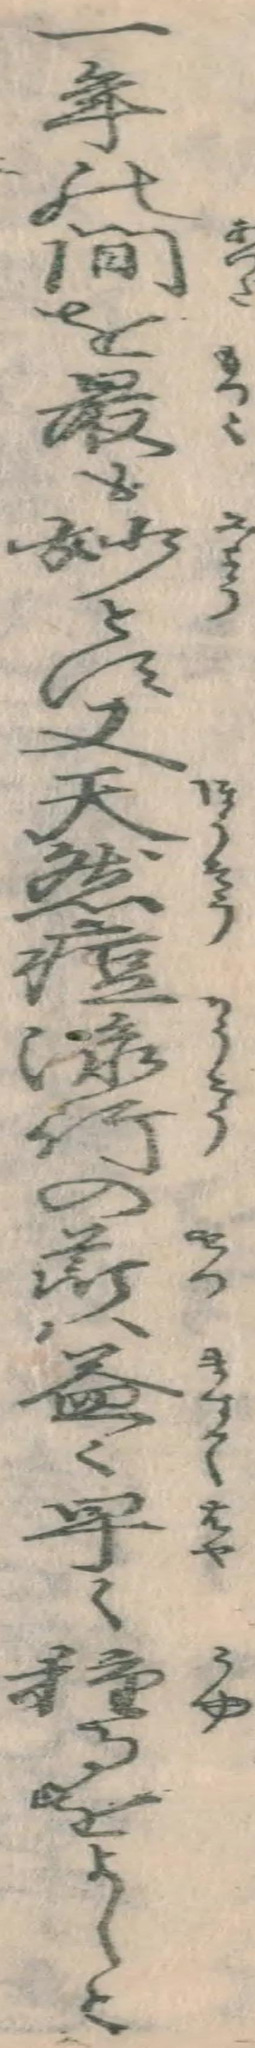一年の間を最も妙とす又天然痘流行の節は益々早く種るをよしと
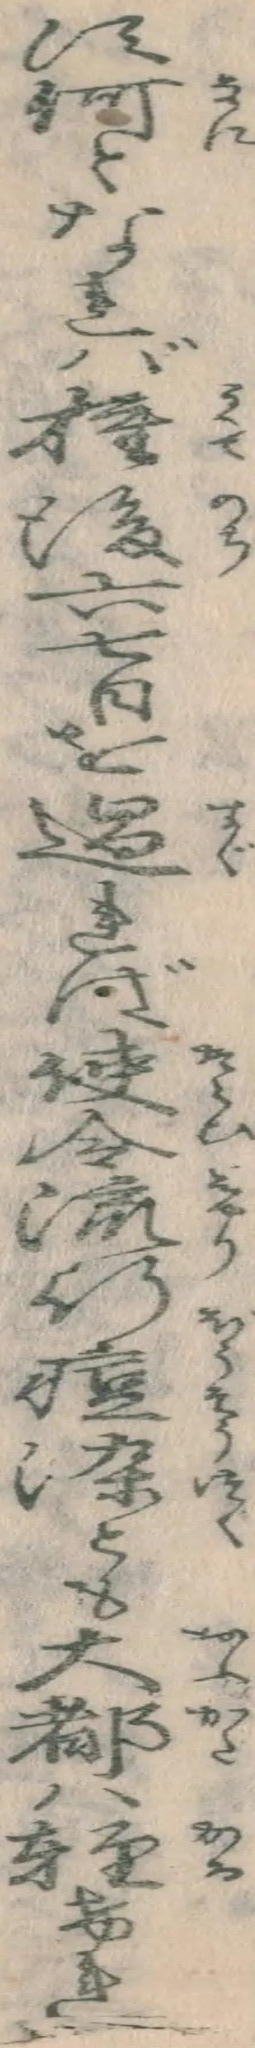す何となれば種後六七日を過れば使令流行痘染とも大都は軽けれ
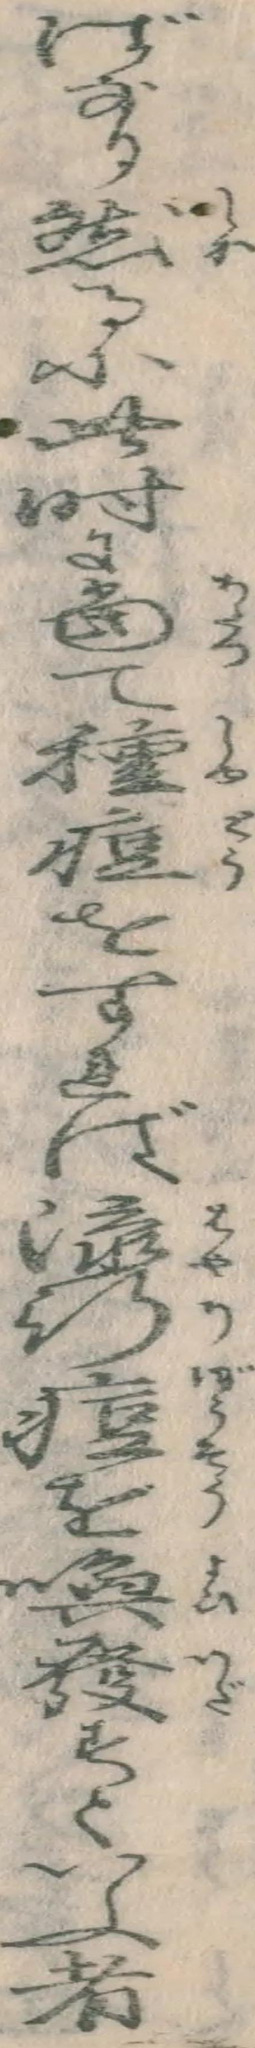ばなり然るに此時に当て種痘をすれば流行痘を喚発すといふ者
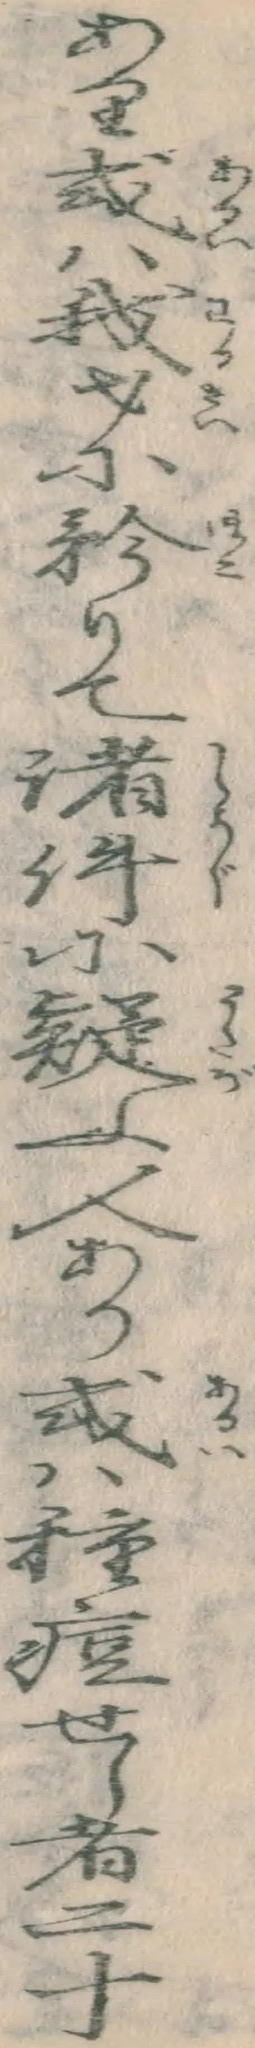あり或は我才に稔りて諸件に疑ふ人あり或は種痘せし者二十
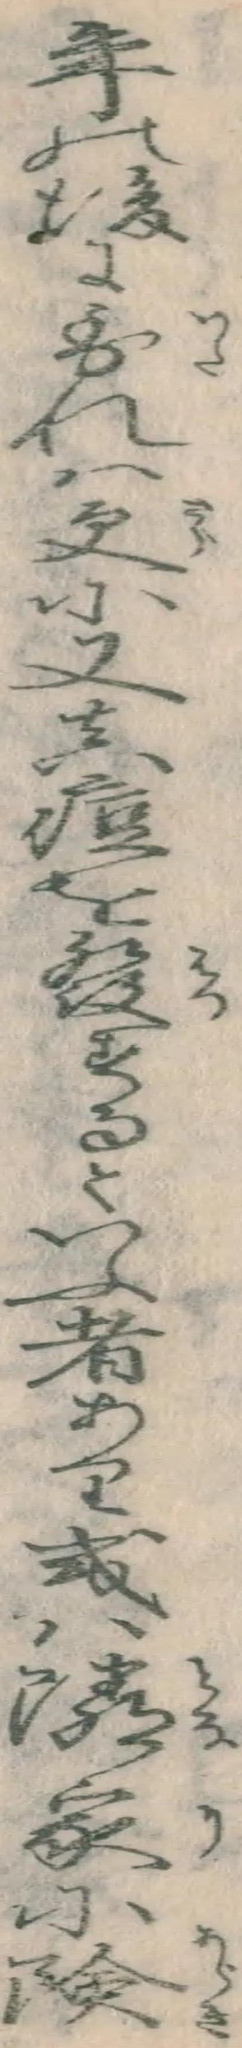年の後に至れは更に又真痘を発するといふ者あり或は隣家に険
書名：種痘辨
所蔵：国立国会図書館 National Diet Library, JAPAN
